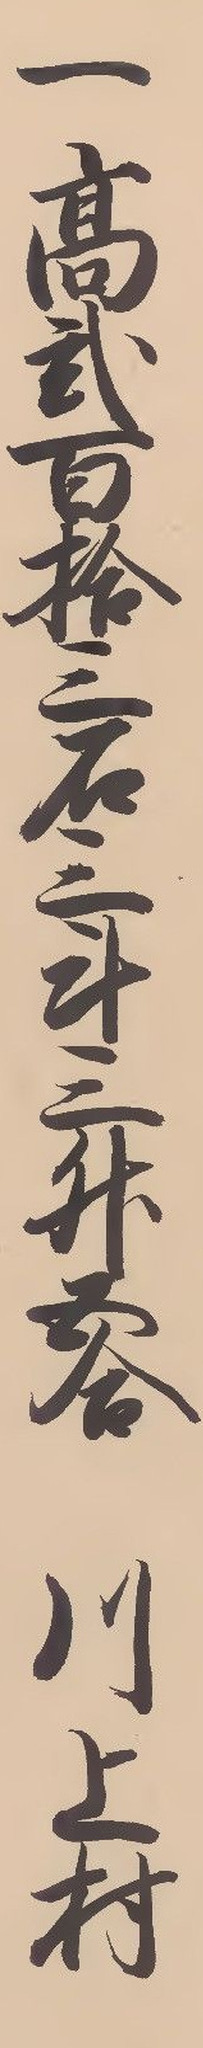一高弐百拾三石三斗三升五合川上村
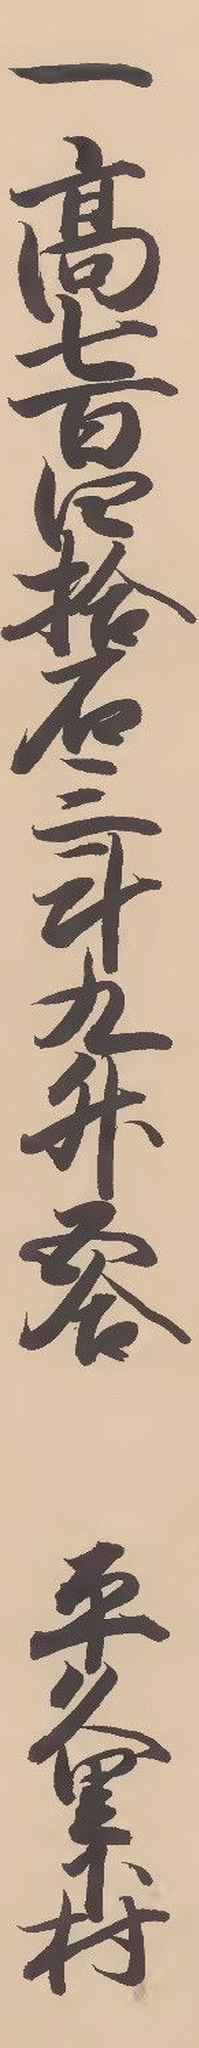一高七百四拾石三斗九升五合平久里下村
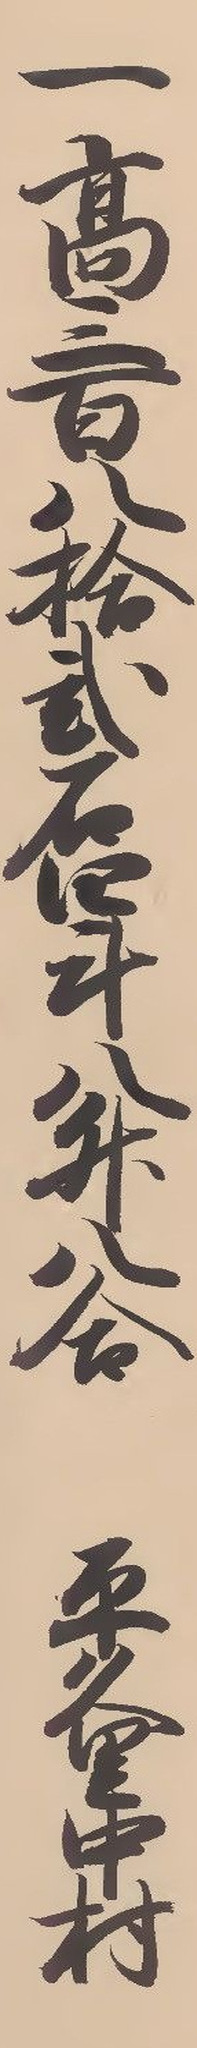一高三百八拾弐石四斗八升八合平久里中村
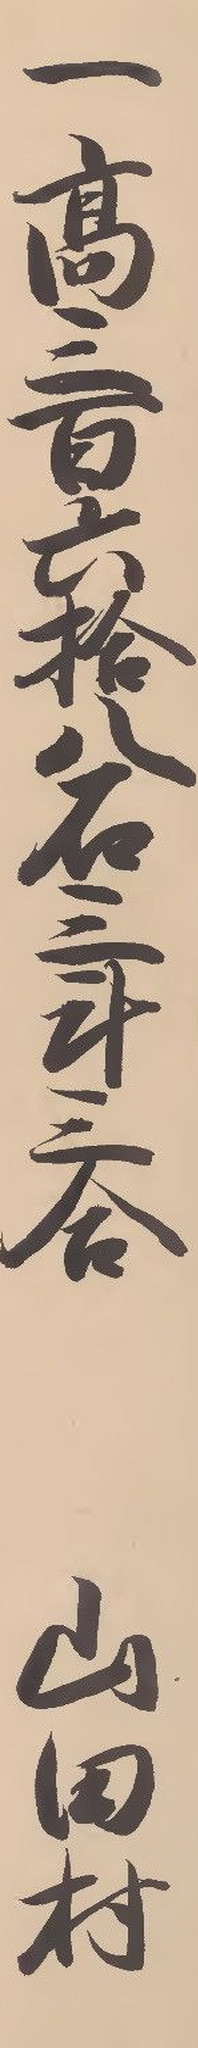一高三百六拾八石三斗三合山田村
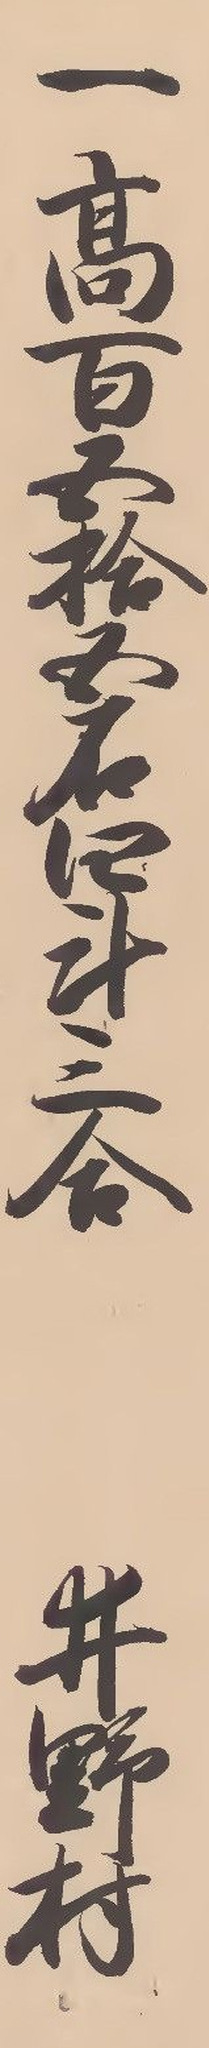一高百五拾五石四斗三合井野村
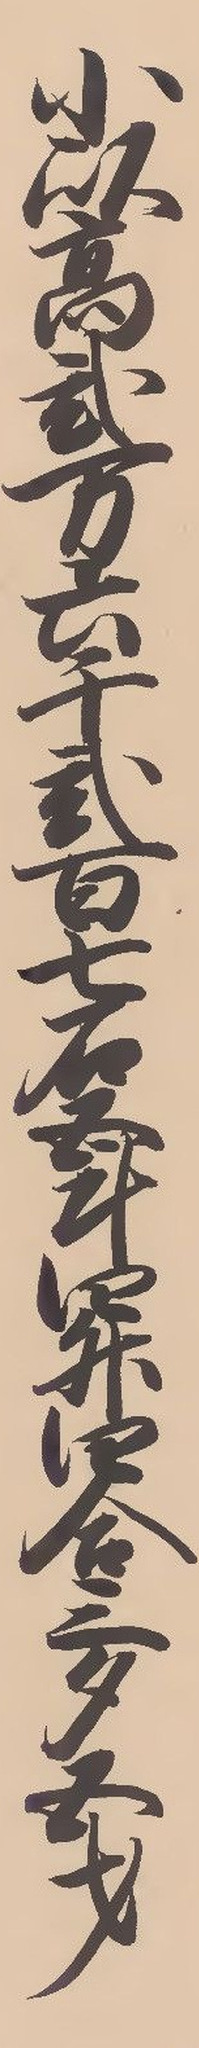小以高弐万六千弐百七石五斗四升四合三勺五才

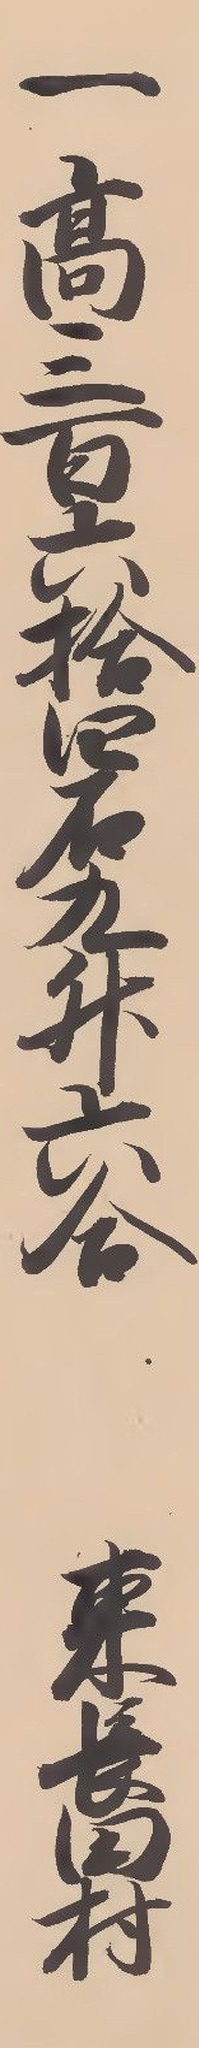一高三百六拾四石九升六合東長田村
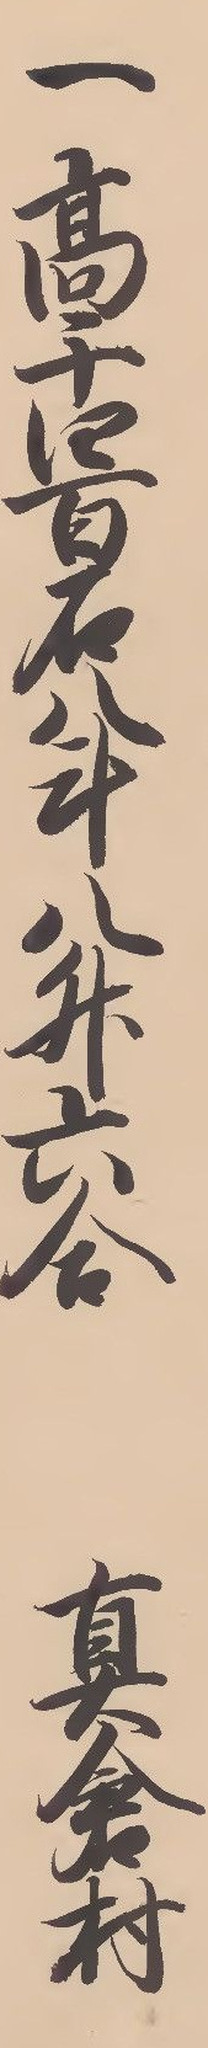一高千四百石八斗八升六合真倉村
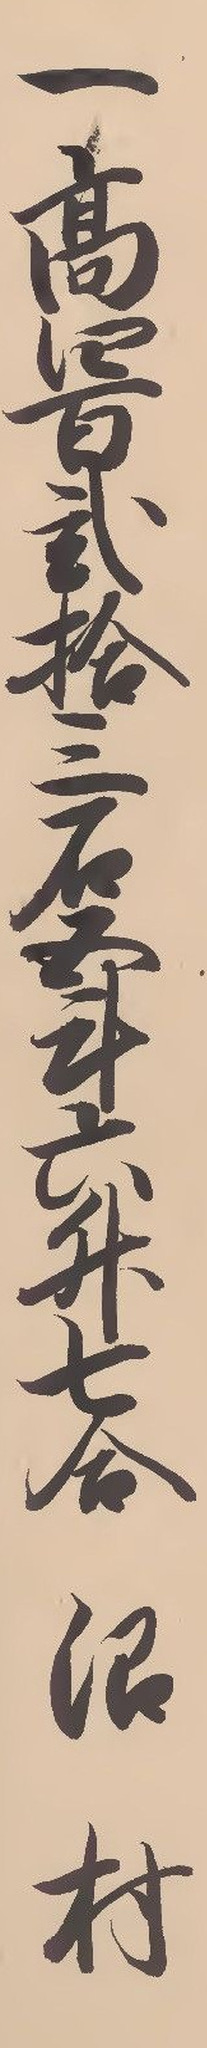一高四百弐拾三石五斗六升七合沼村
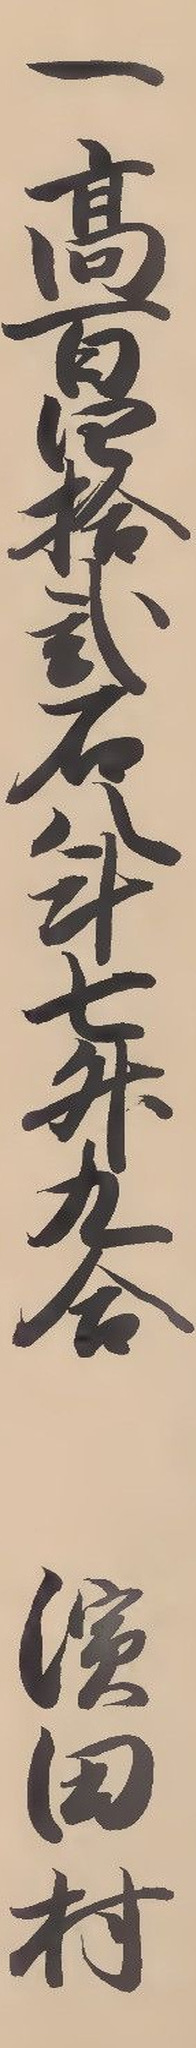一高百四拾弐石八斗七升九合浜田村
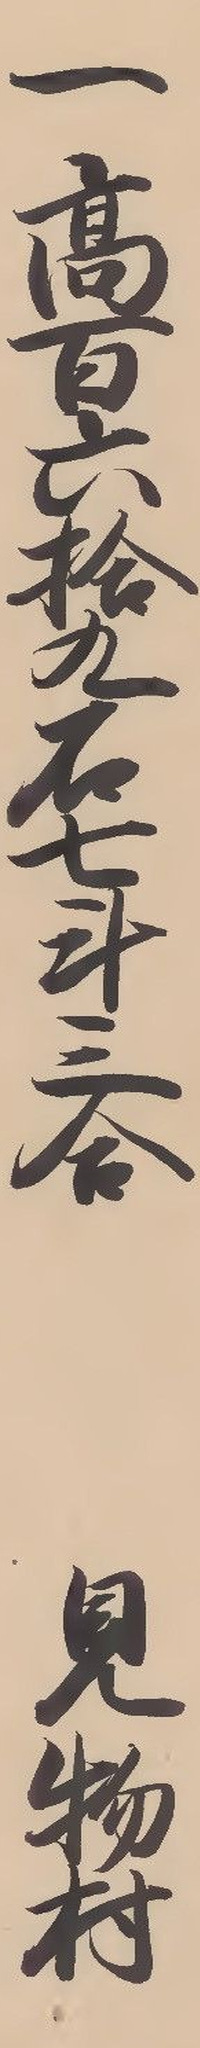一高百六拾九石七斗三合見物村
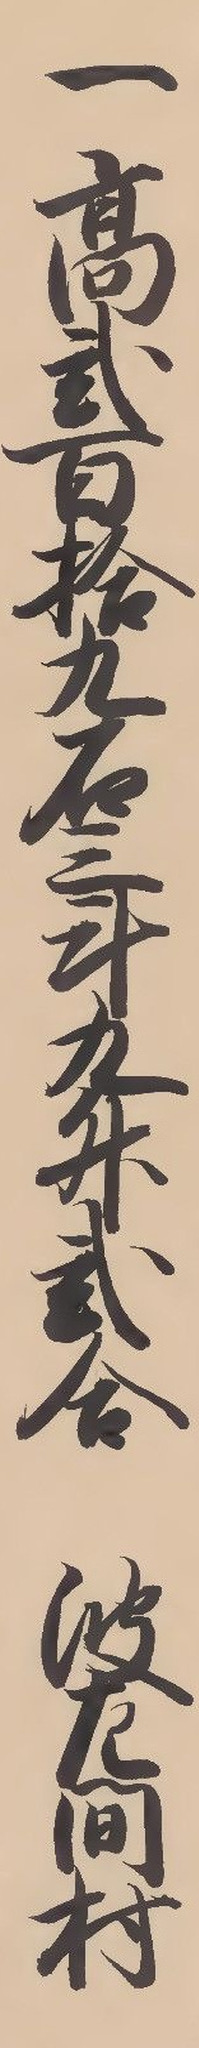一高弐百拾九石三斗九升弐合波左間村
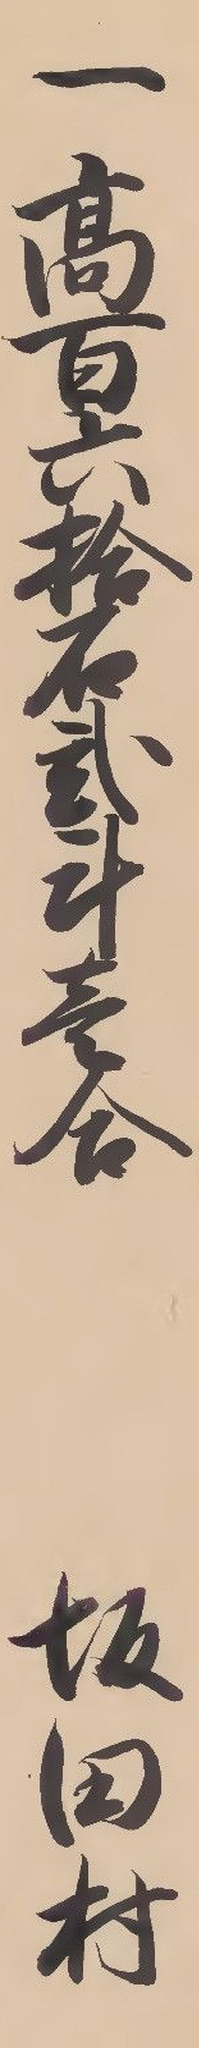一高百六拾石弐斗壱合坂田村

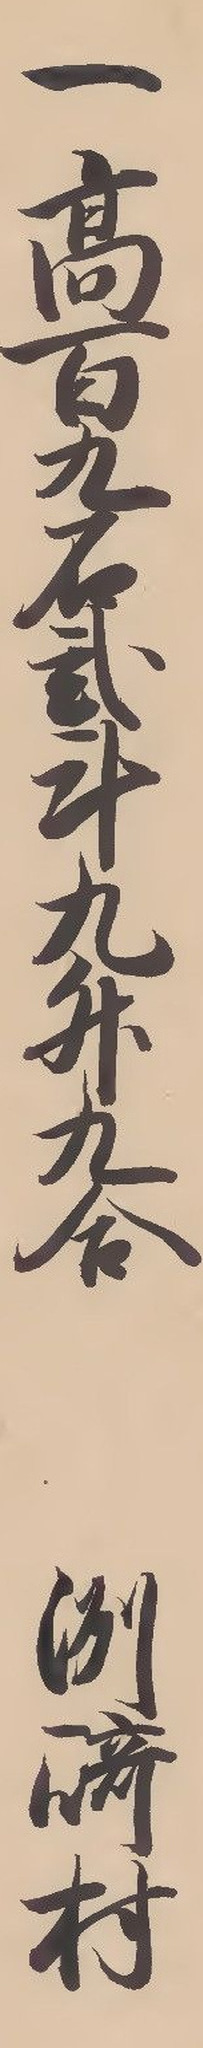一高百九石弐斗九升九合洲崎村
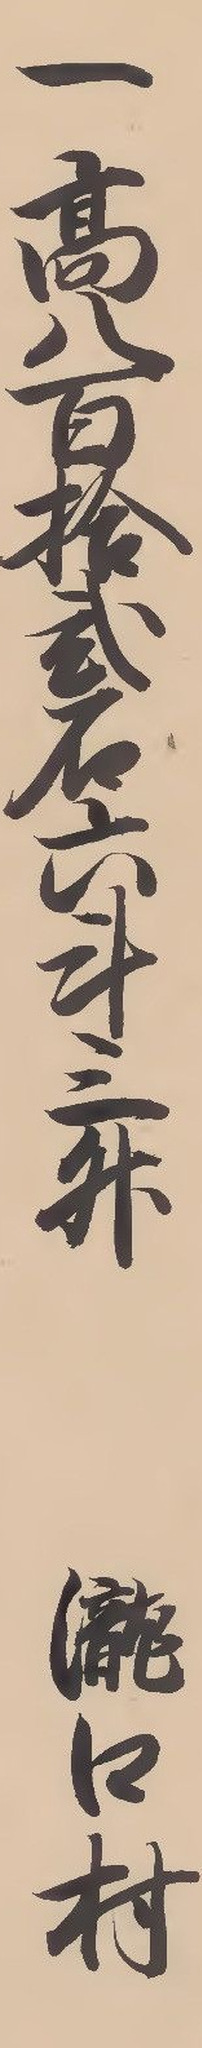一高八百拾弐石六斗三升滝口村
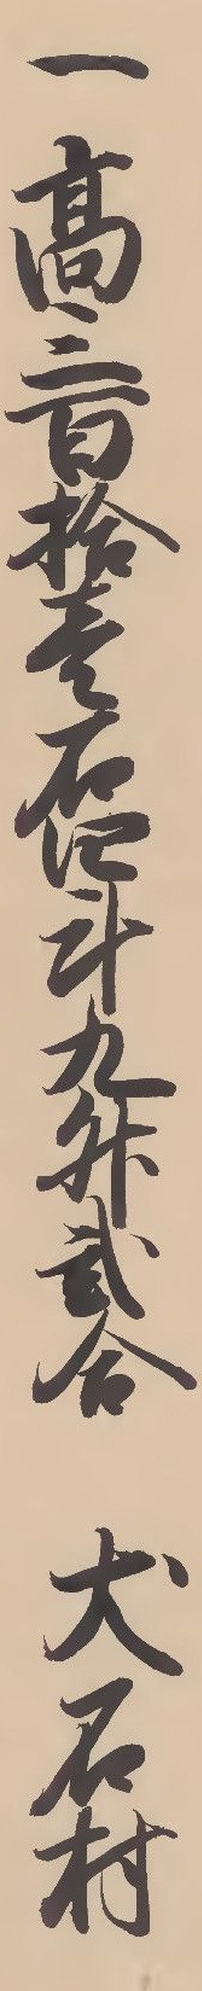一高三百拾壱石四斗九升弐合犬石村
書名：安房国郷帳
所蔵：国立公文書館 National Archives of Japan
